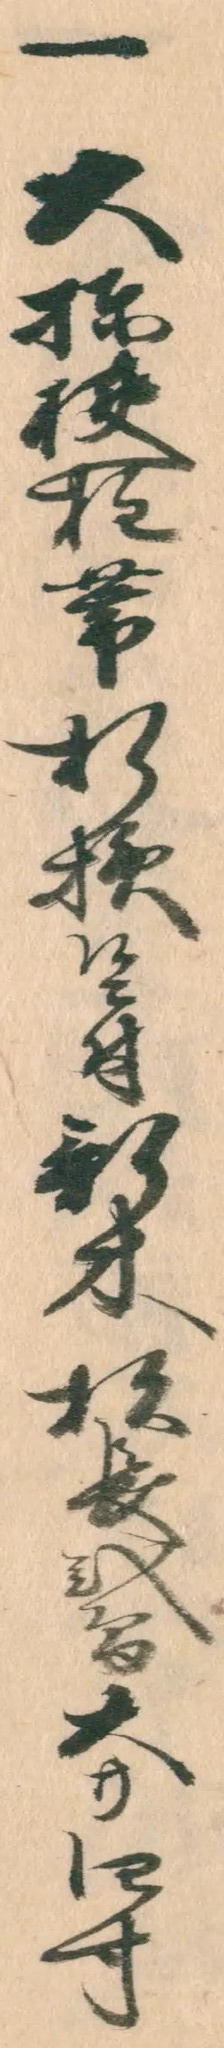一大棟挟柱帯折損候に付新木杉長弐間大さ四寸
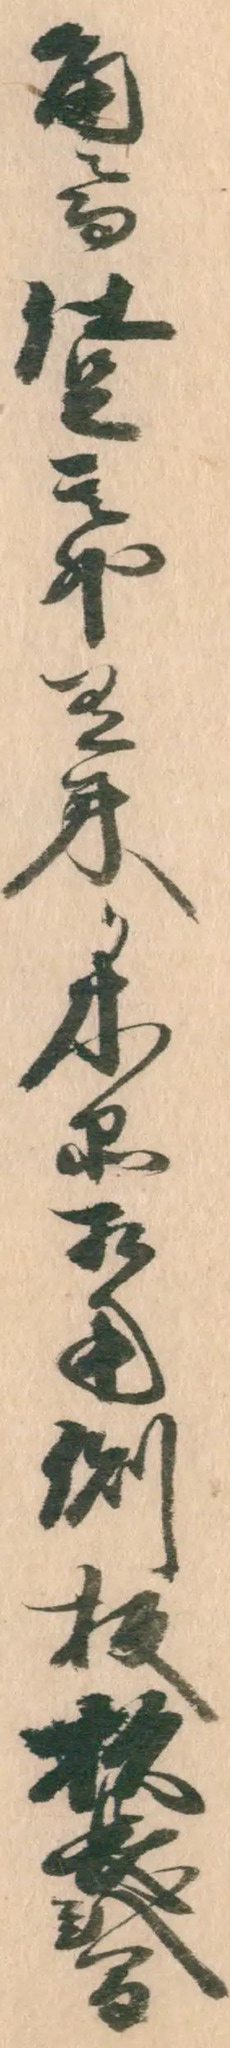角に而仕足其外有来り木品相用側板杉長弐間
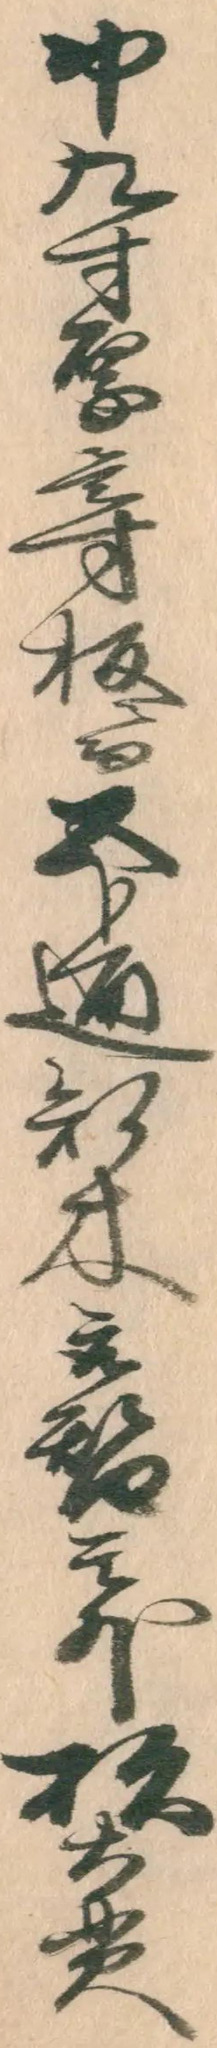巾九寸厚壱寸板に而五分通新木取替其外杉大貫

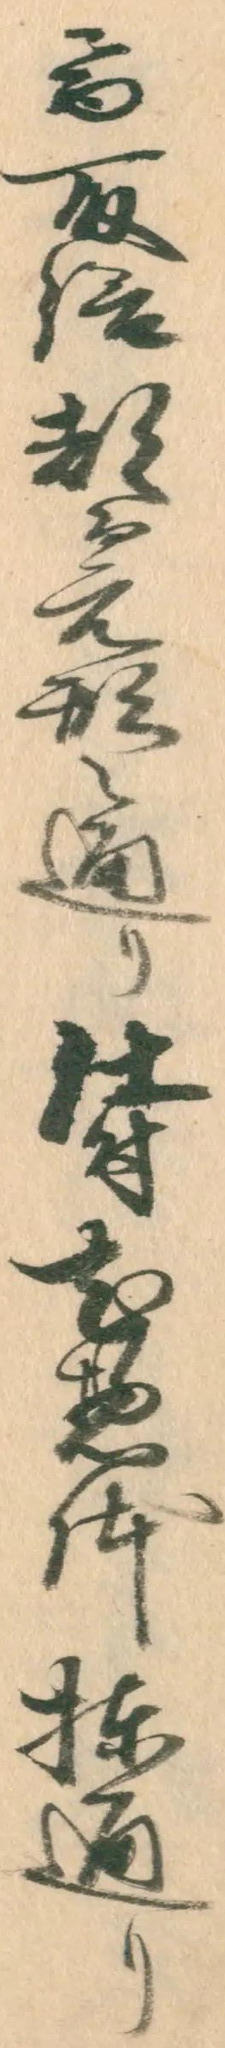に而取繕都而元形之通り仕付尤惣体棟通り
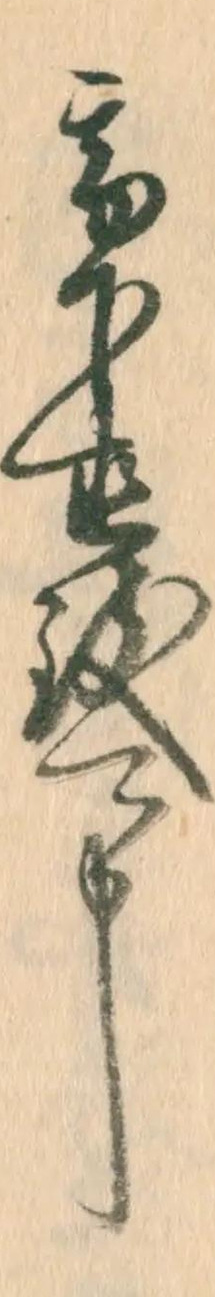高下直致可申候
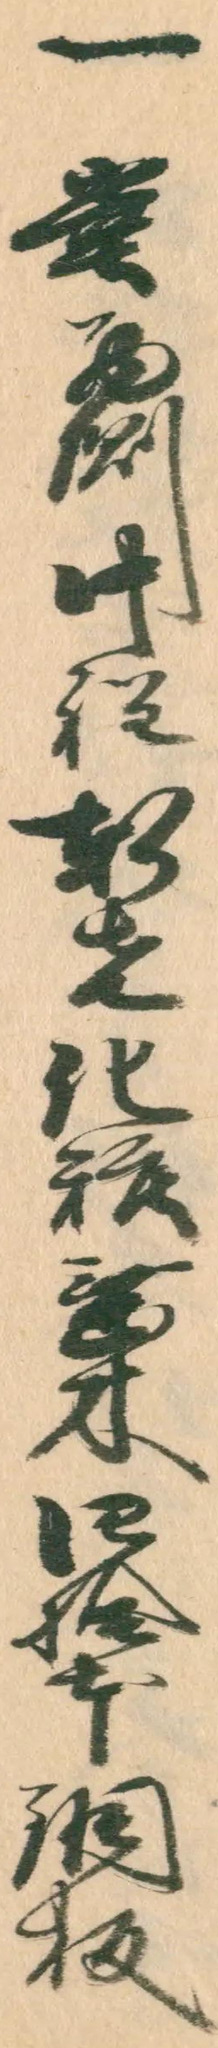一堂西側中程軒先化粧垂木四拾本銅板
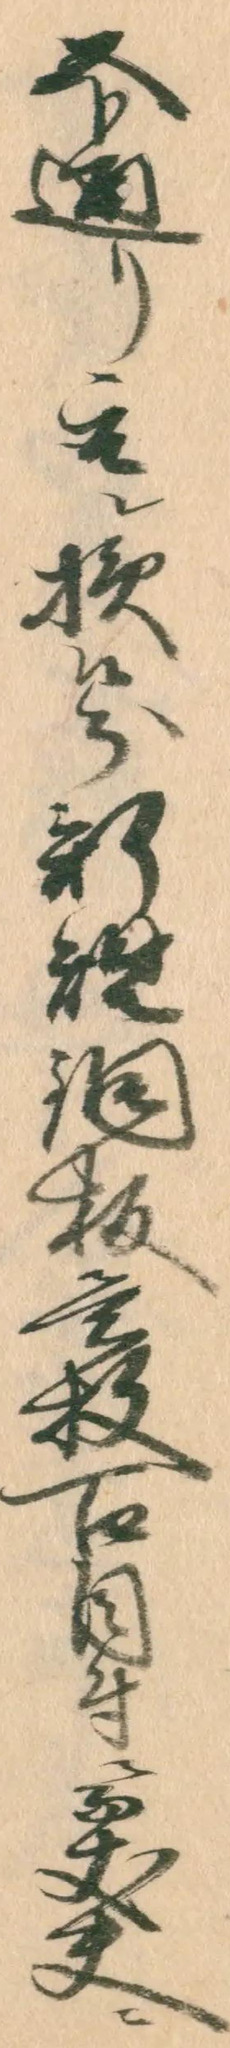五分通り取れ損候分新規銅板壱枚百目付に而丈夫に
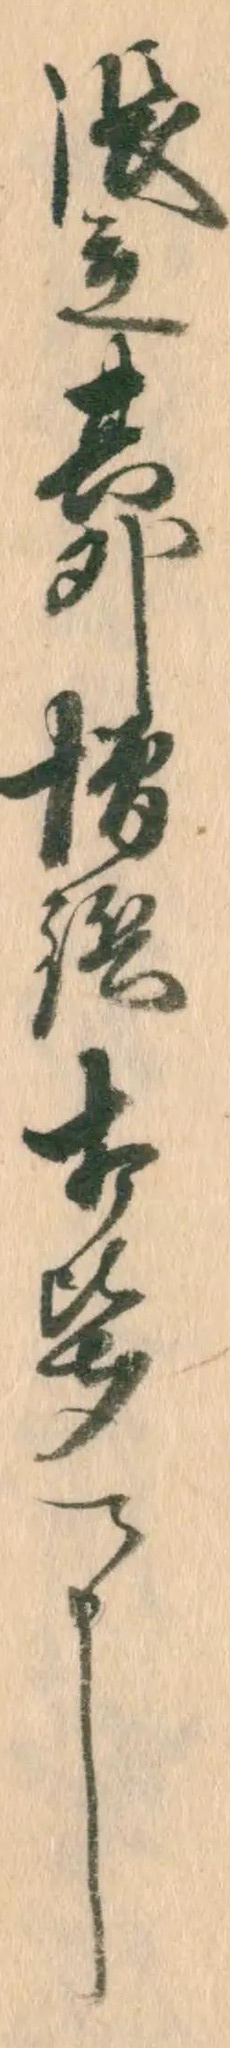張立其外増鋲打堅め可申候
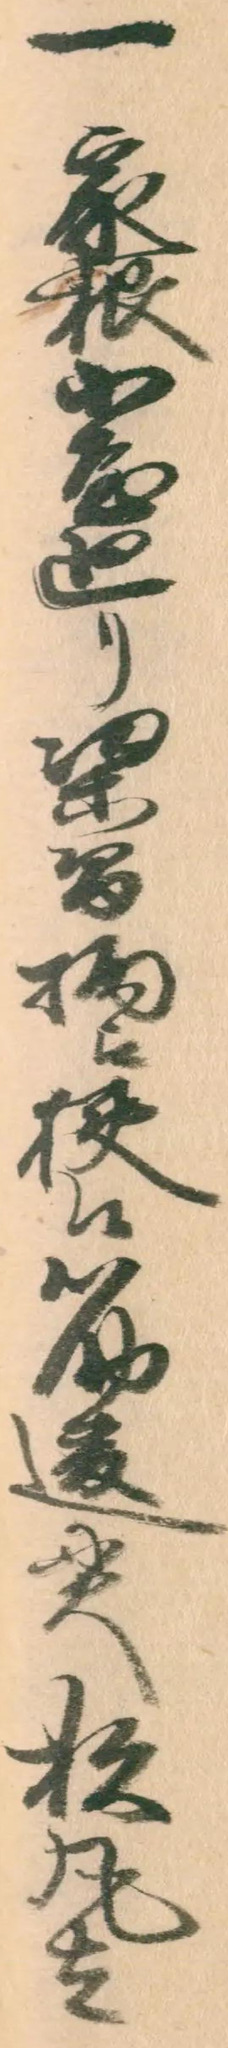一家根小屋廻り梁間柄え挟候筋違貫杉丸太
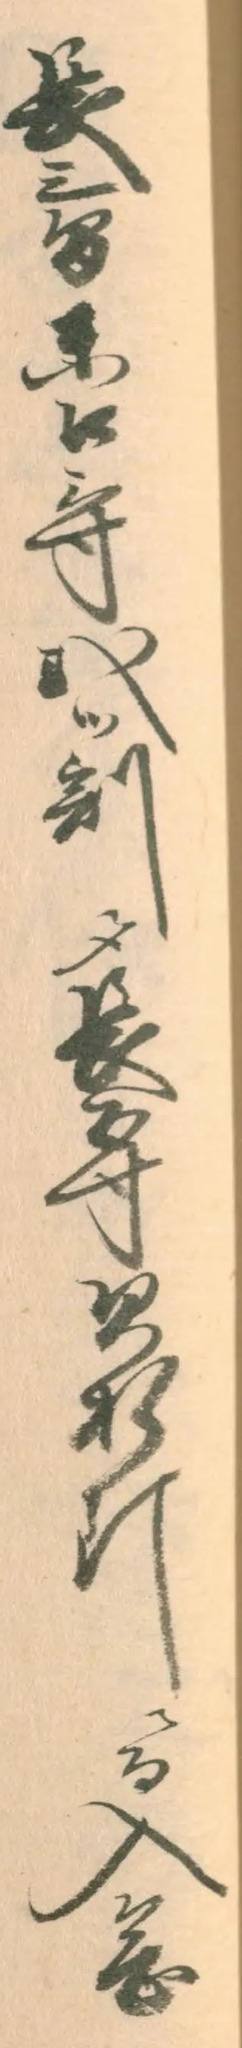長三間末口三寸弐ツ割〆長五寸欠折釘に而入念
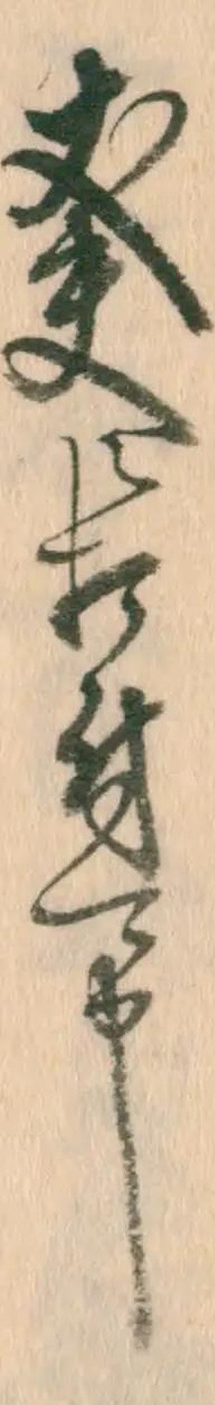丈夫に相付可申候
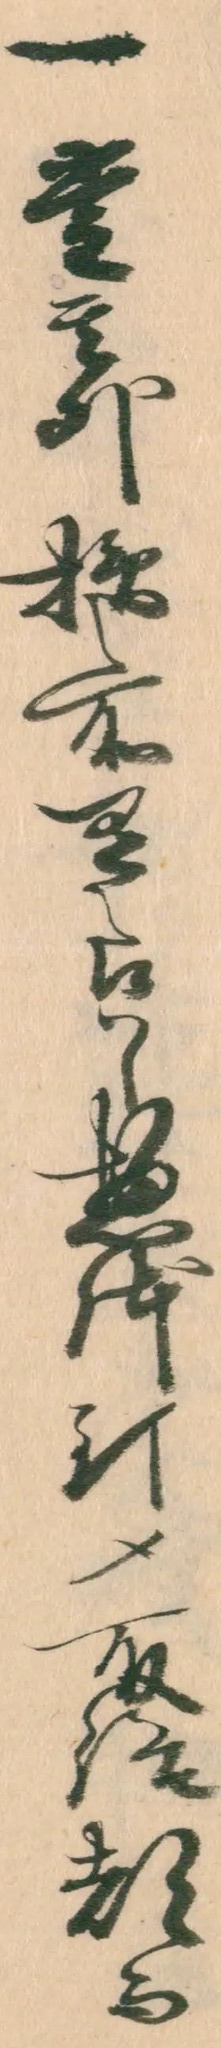一堂其外損之所有之候はゝ惣体釘〆取繕都而
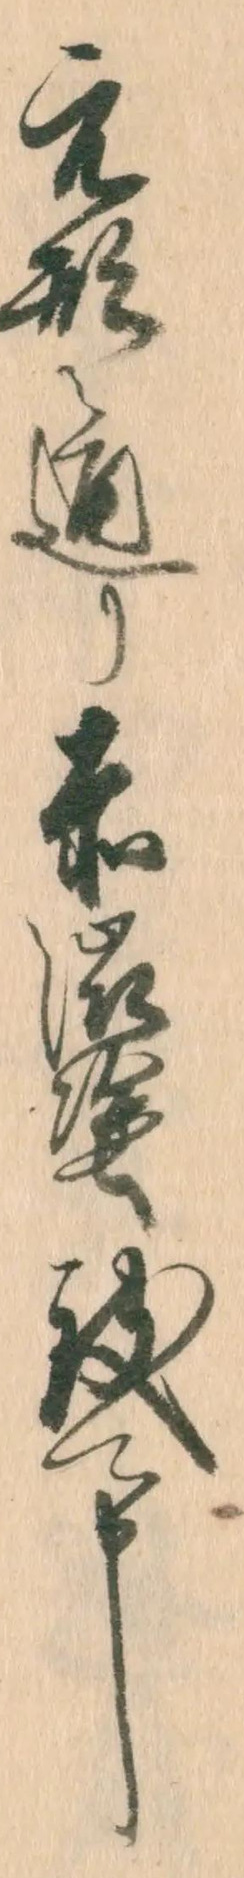元形之通り赤渋塗致可申候
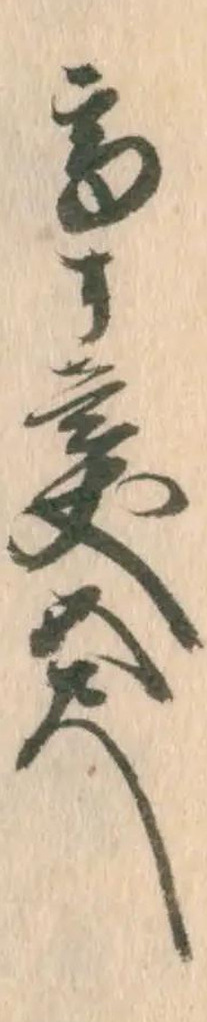高さ壱丈五尺

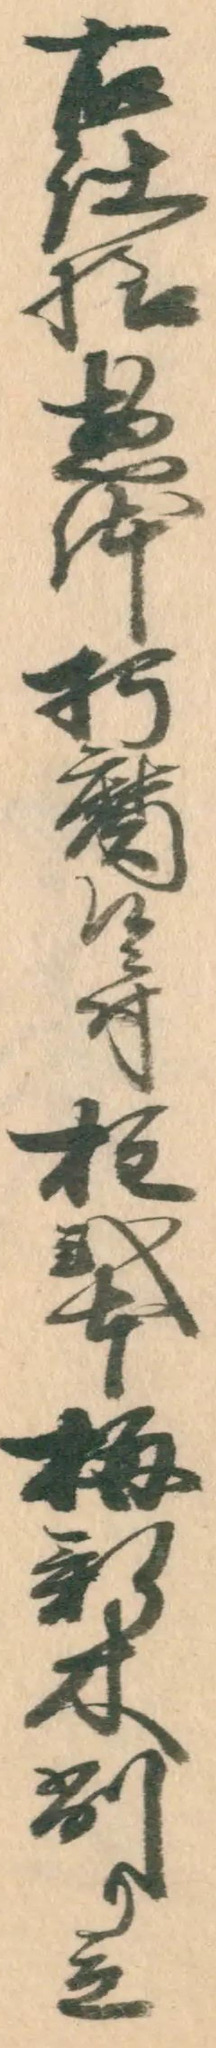右仕様惣体朽腐候に付柱弐本栂新木削り立
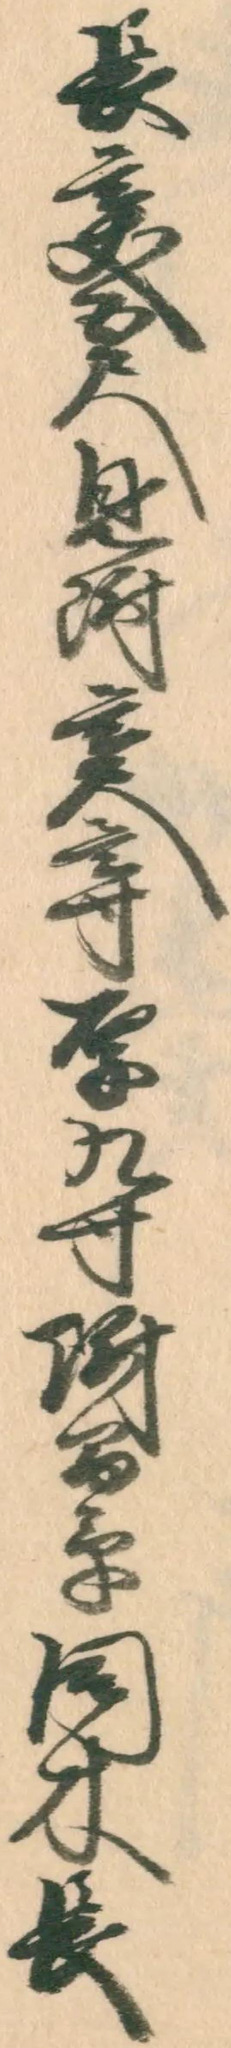長壱丈五尺見附壱尺壱寸厚九寸附間草同木長
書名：三十三間堂. [1]
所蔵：国立国会図書館 National Diet Library, JAPAN
